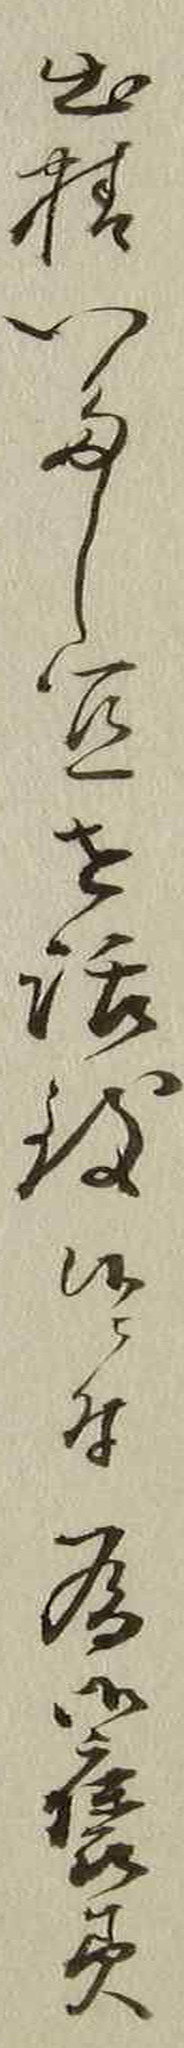出精いたし宜世話致候ニ付為御褒美
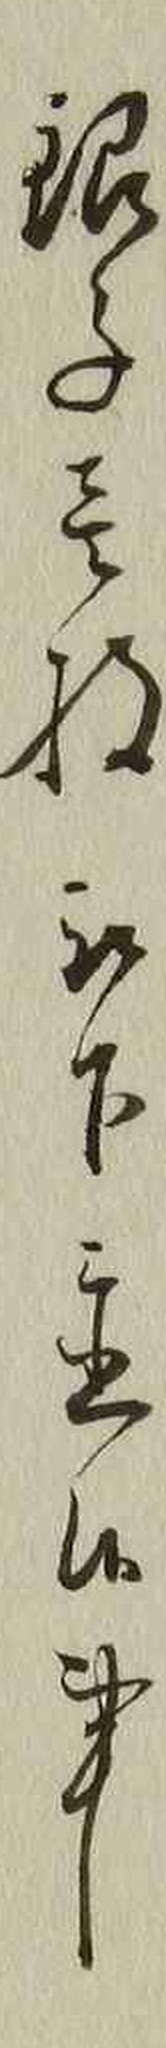銀子壱枚被下置候事
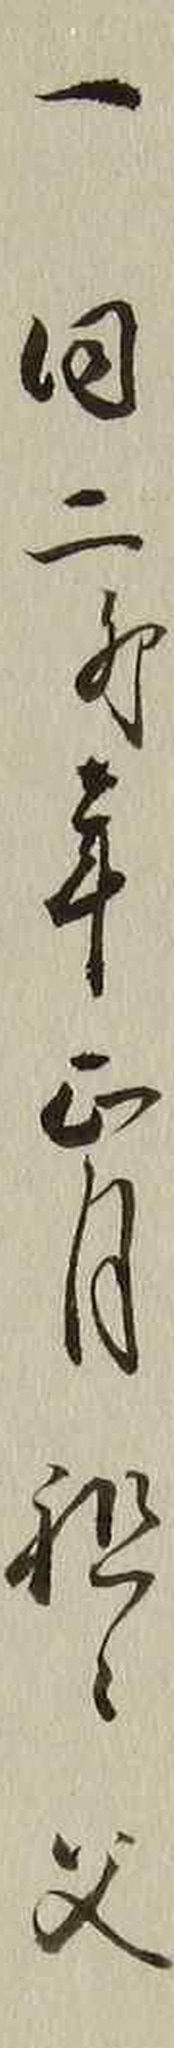一同二卯年正月祖々父
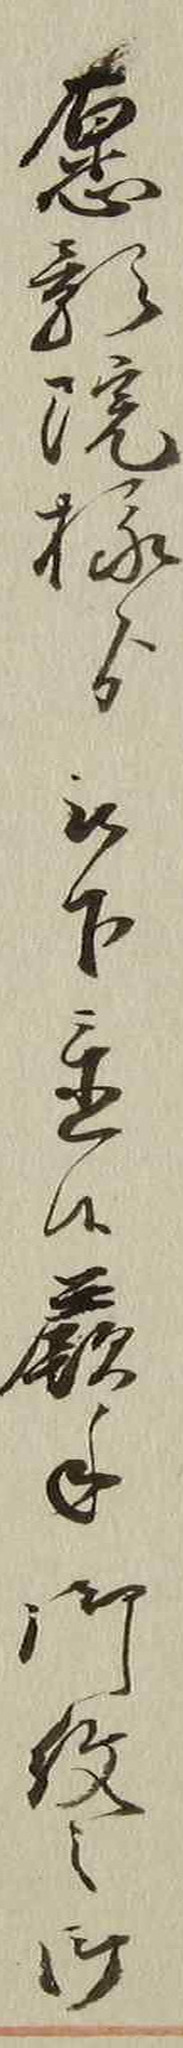愿彰院様ゟ被下置候蕨手御紋之御
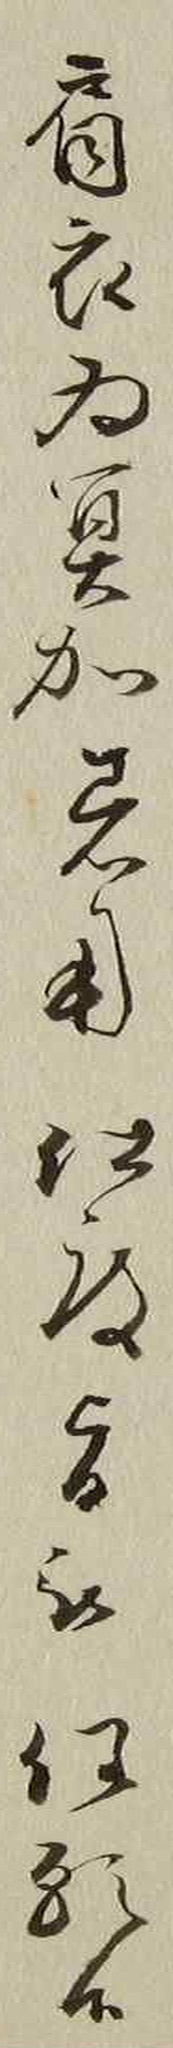肩衣為冥加着用仕度旨被任願候
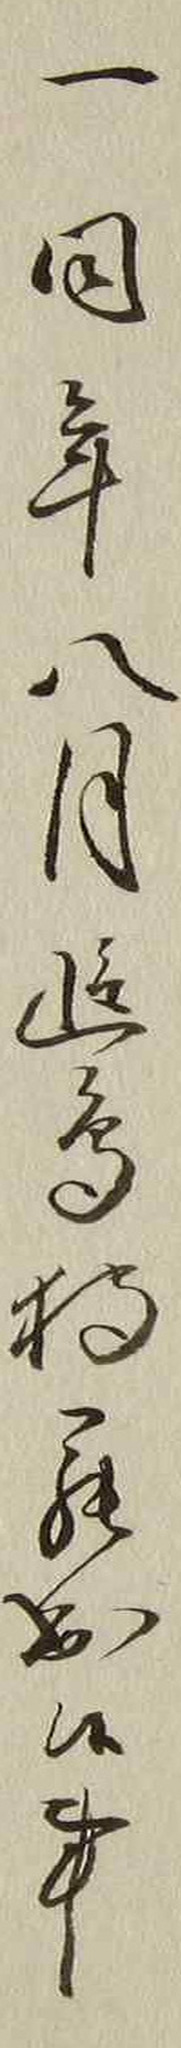一同年八月追鳥狩罷出候事
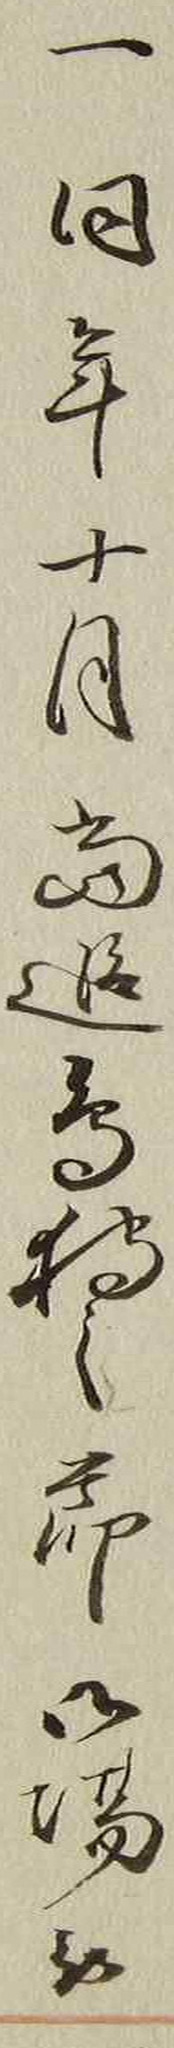一同年十月当追鳥狩之節御場被
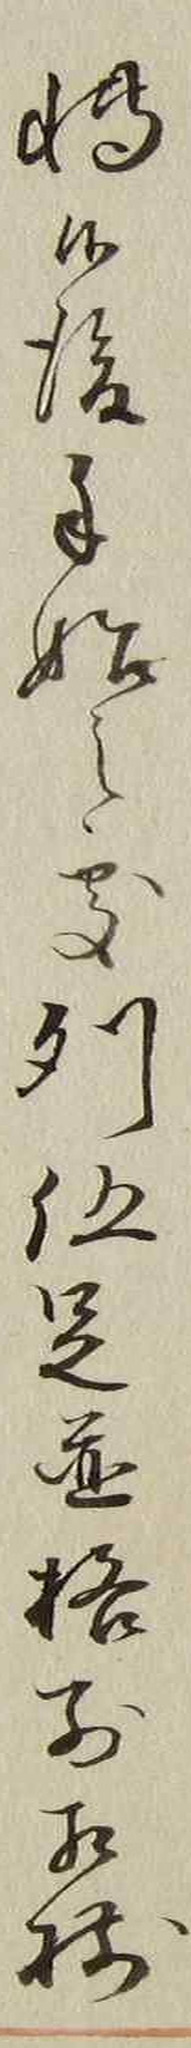転候後手始之処列伍足並格別相揃
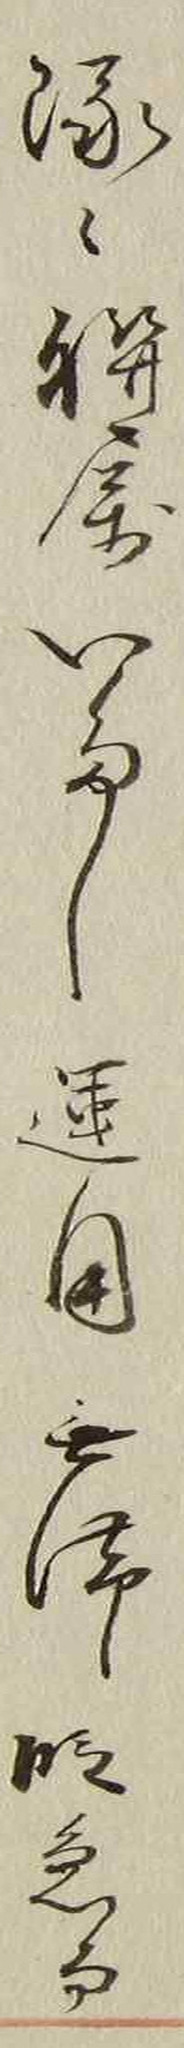隊々聯属いたし運用無滞段急而
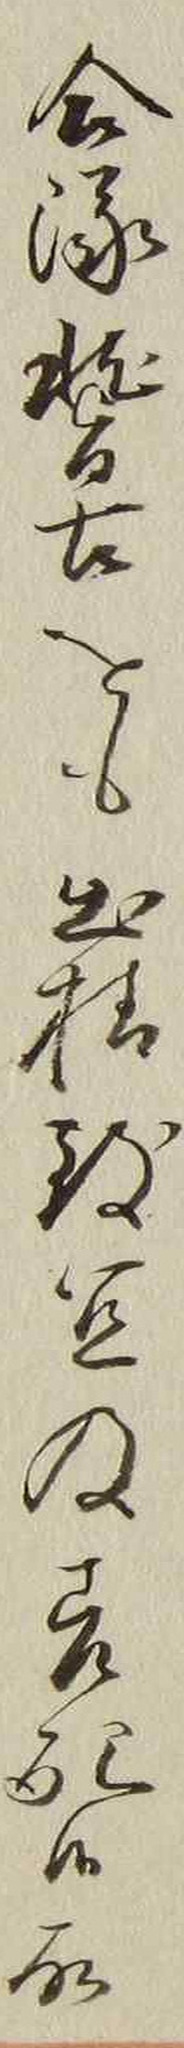合隊稽古をも出精致宜及差配候故
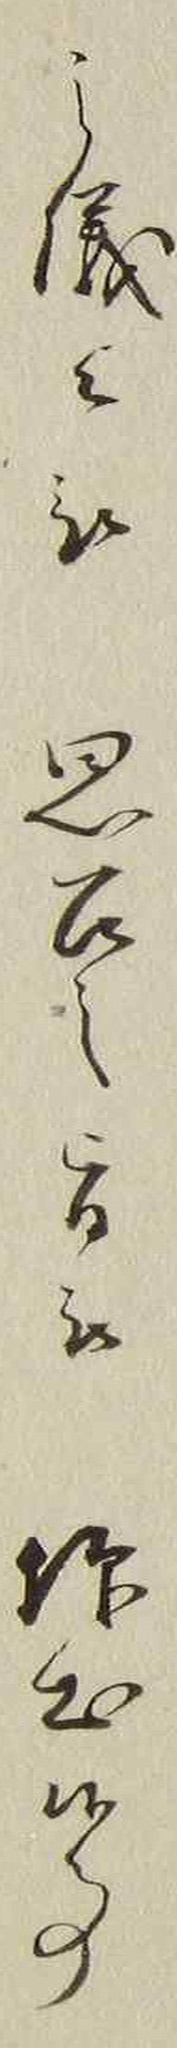之儀与被思召之旨被仰出候事
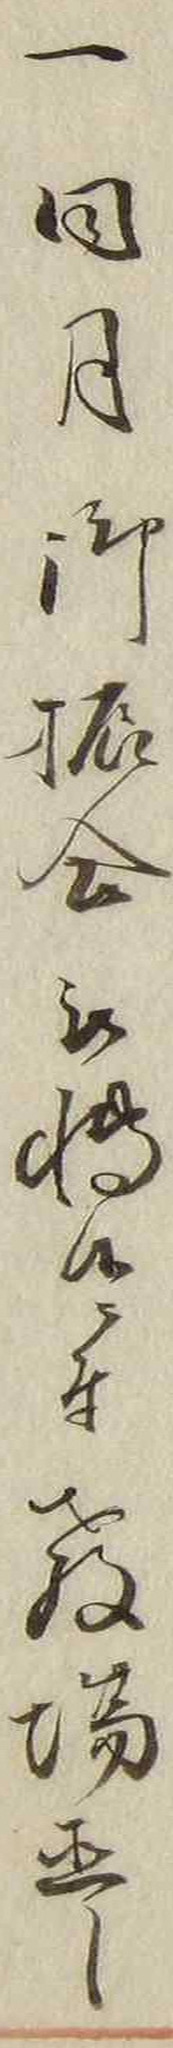一同月御振合被転候ニ付教場直し

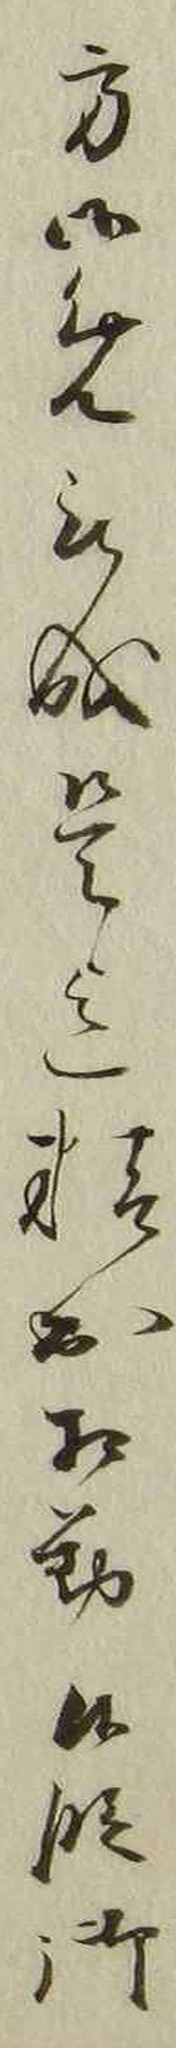方御免被成是迄精出相勤候段御
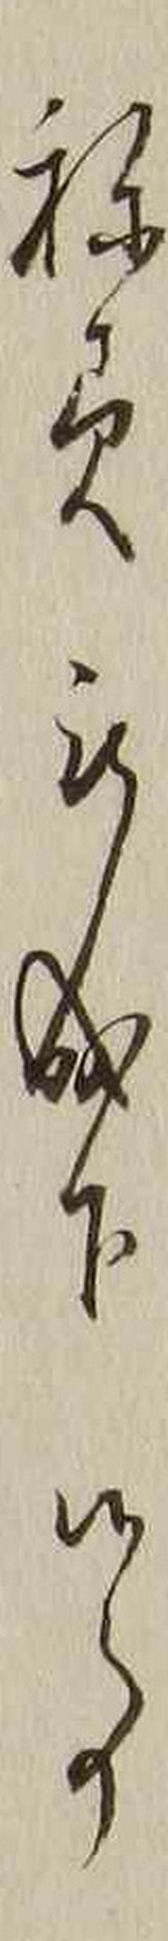称美被成下候事
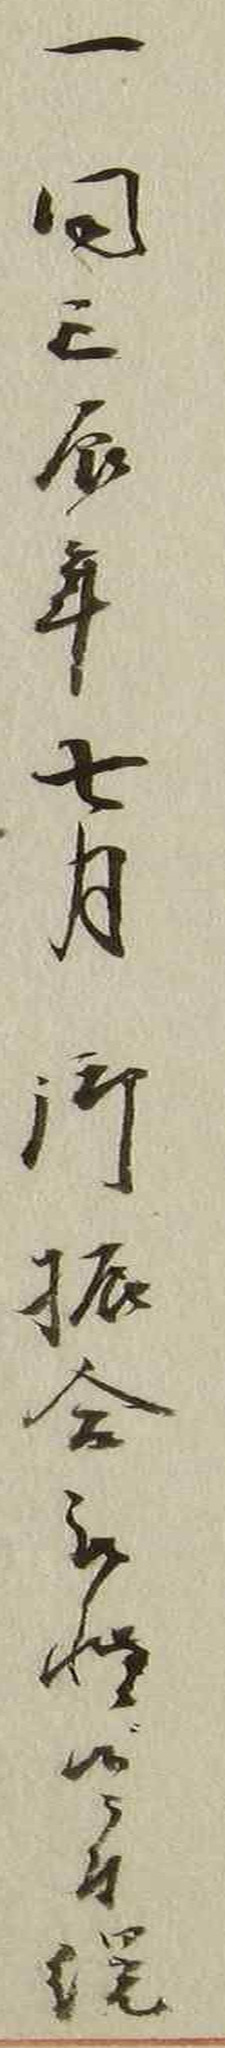一同三辰年七月御振合被転候ニ付縨
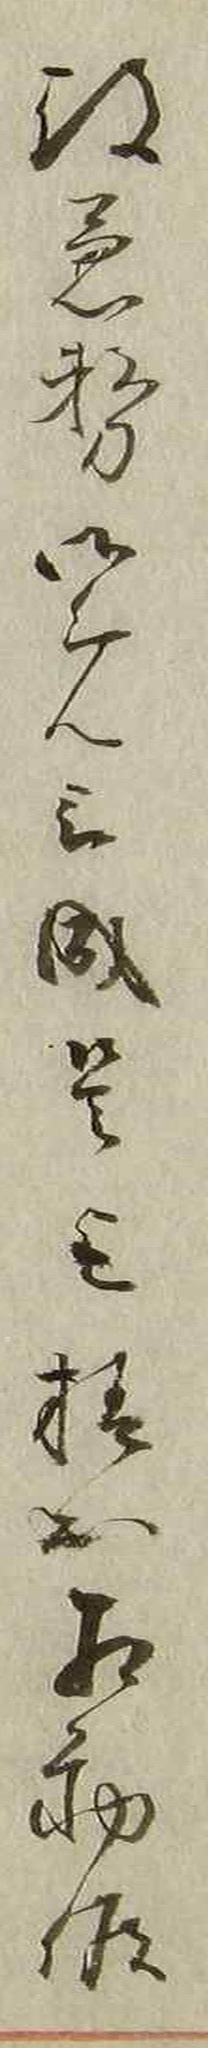役兼務御免被成是迄精出相勤候
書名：諸士系譜　巻之122　よ之部5
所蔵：会津若松市立会津図書館
